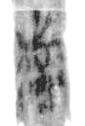南
